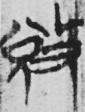敓（悅）
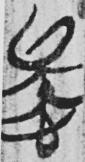○（擬）
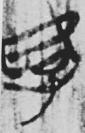好
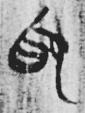色
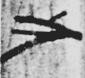之
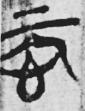○（願）
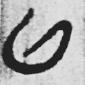㠯（以）
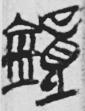鍾
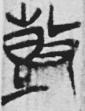鼓
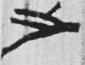之
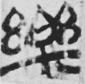樂
